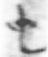屯
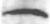一
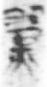翼
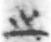之
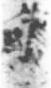雘
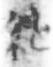紳（靷）
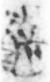○（豻）
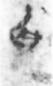首
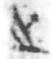之
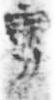○（蒙）
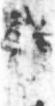○（豻）
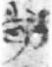削
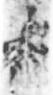顯（韅）
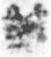鞅
